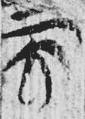而
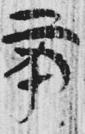不
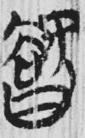智（知）
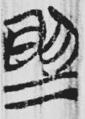則（則）
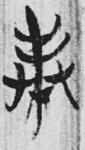奉（逢）
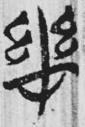○（災）
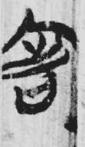害
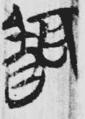○（聞）
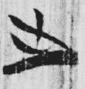之
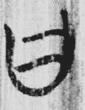曰
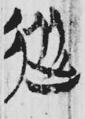從
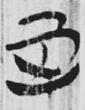正（政）
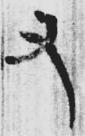又（有）
